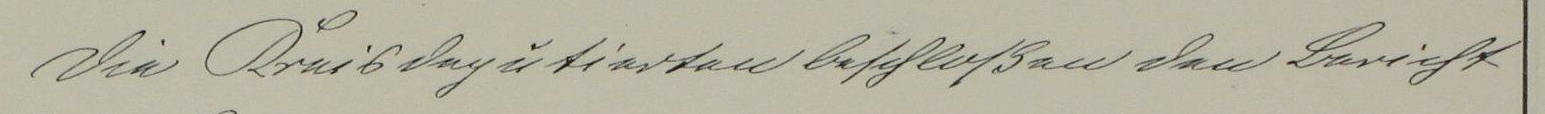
Die Kreisdeputierten beschloßen den Bericht
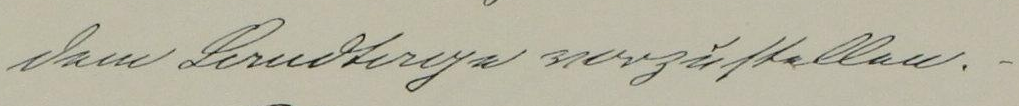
dem Landtage vorzustellen.
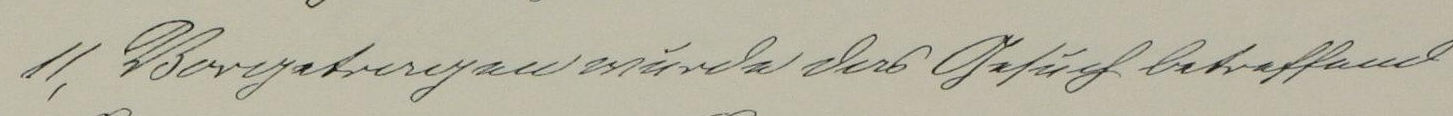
11. Vorgetragen wurde das Gesuch betreffend
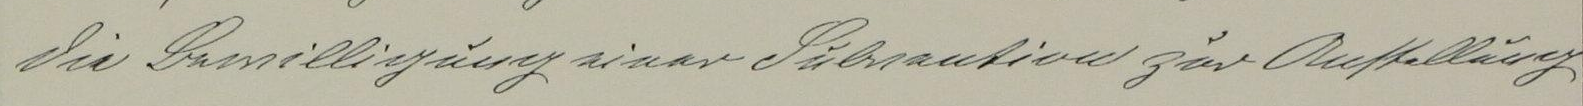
die Bewilligung einer Subvention zur Anstellung
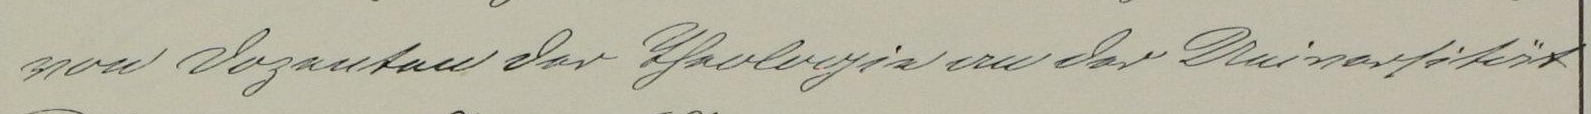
von Dozenten der Theologie an der Universität
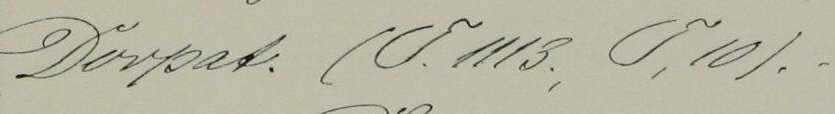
Dorpat. (T.1113; T.10).
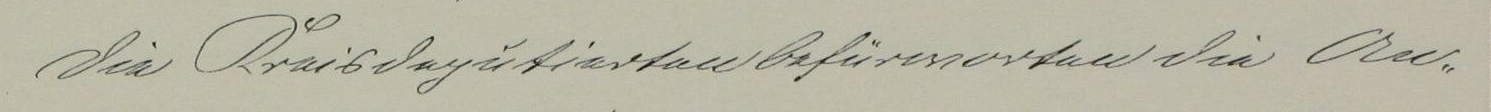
Die Kreisdeputierten befürworten die An-
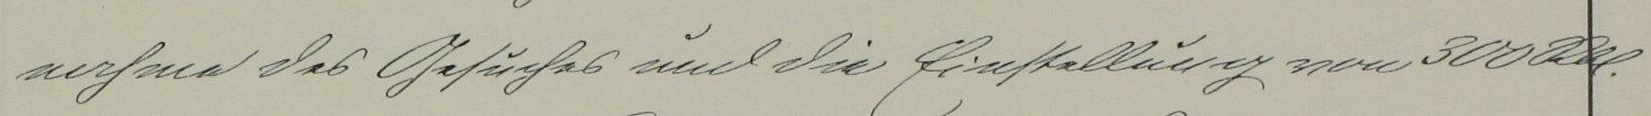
nahme des Gesuches und die Einstellung von 300 Rbl.
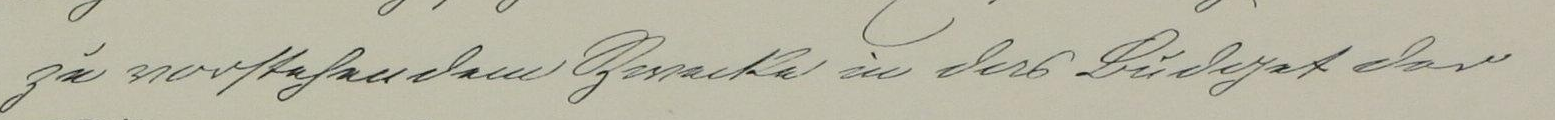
zu vorstehendem Zwecke in das Budget der
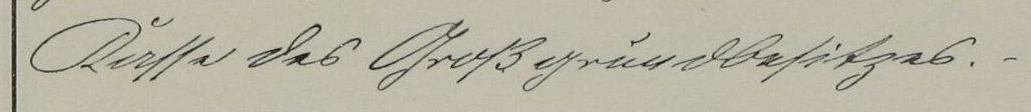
Kasse des Großgrundbesitzes.
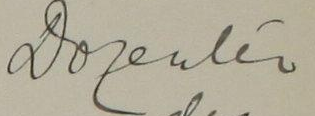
Dozenten
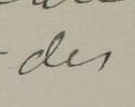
der
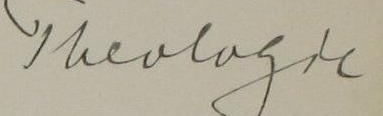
Theologie
